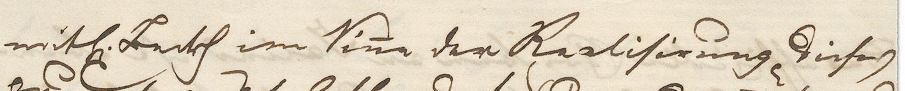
mit H. Beckh im Sinne der Realisirung dieses
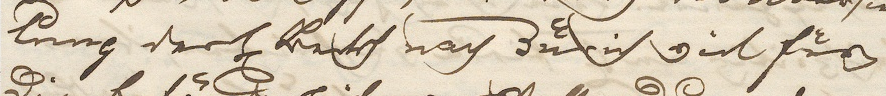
lung des H. Beckh nach Zürich viel für
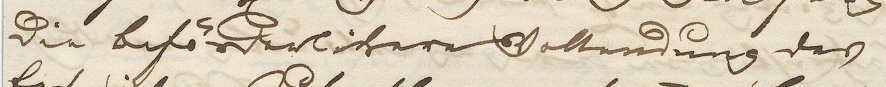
die beförderlichere Vollendung des
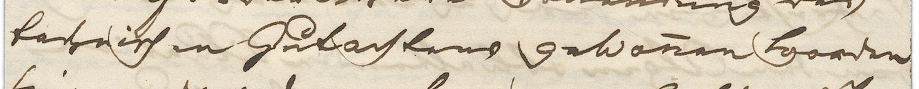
technischen Gutachtens gewonnen worden
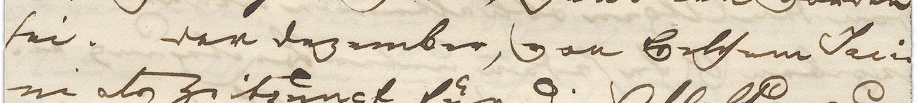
sei. Der Dezember, von welchem Jaci-
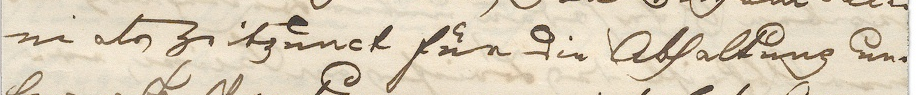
ni als Zeitpunct für die Abhaltung un-
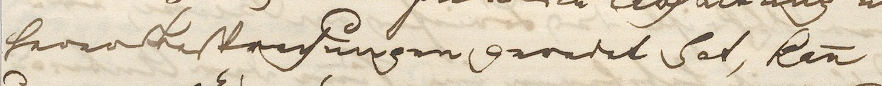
serer Besprechungen geredet hat, kann
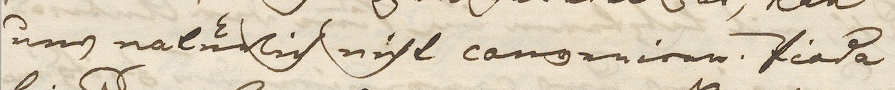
uns natürlich nicht conveniren. Pioda
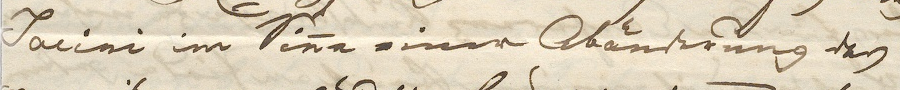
Jacini im Sinne einer Abänderung des
